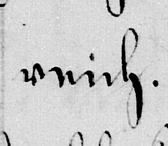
reich.
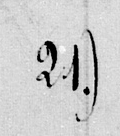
21.)
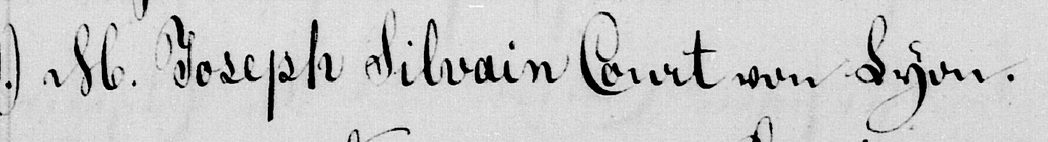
M. Joseph Silvain Corat von Lyon.
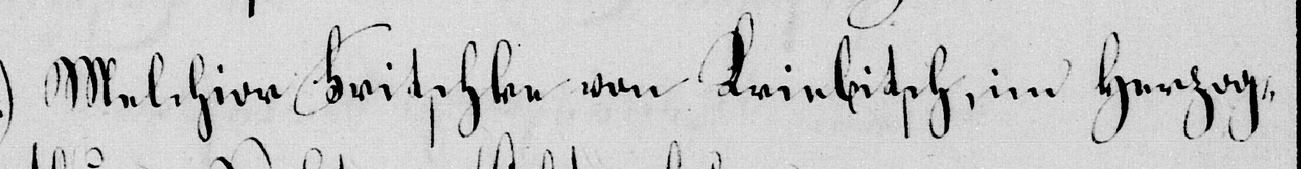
Melchor Fritschke von Kriebitsch, im Herzog¬
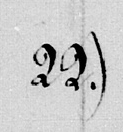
23.)
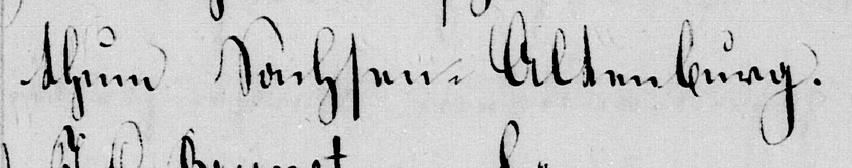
thum Sachsen-Altenburg.
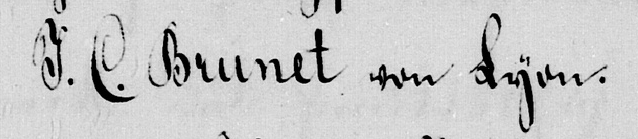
J. C. Brunet von Lyon.
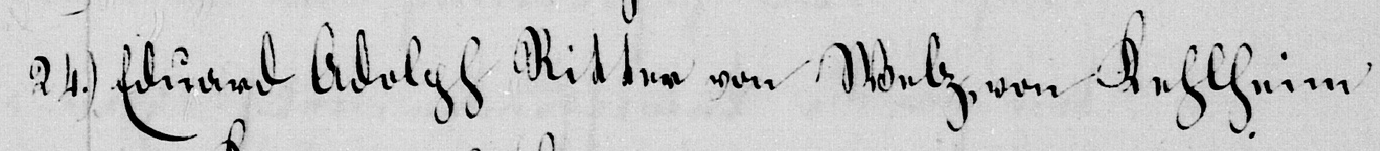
24.) Eduard Adolph Ritter von Welz, von Kehlheim
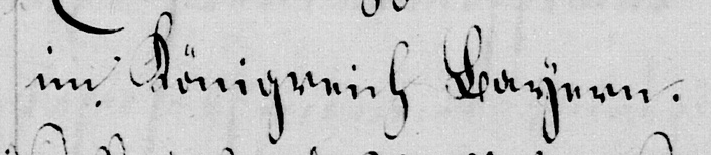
im Königreich Bayern.
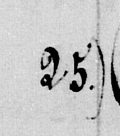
25.)
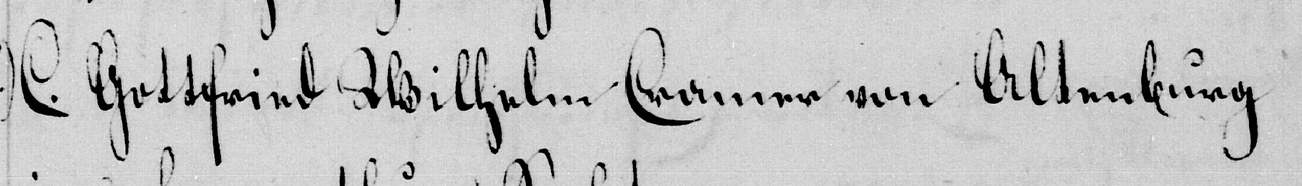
C. Gottfried Wilhelm Cramer von Altenburg
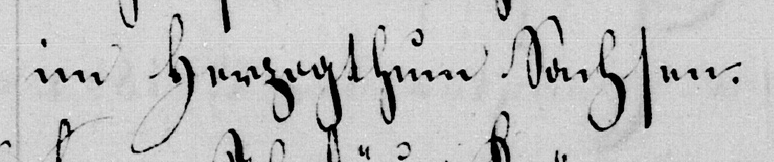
im Herzogthum Sachsen.
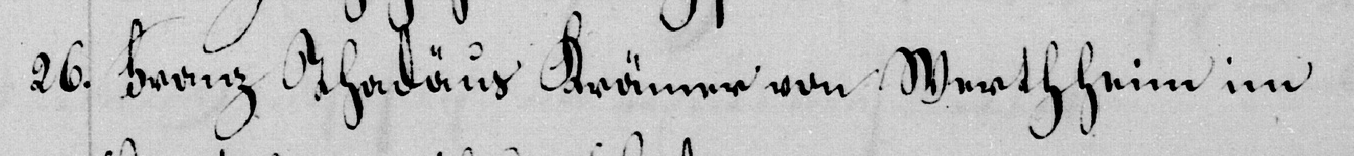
26.) Franz Thadäus Krämer von Werthheim im
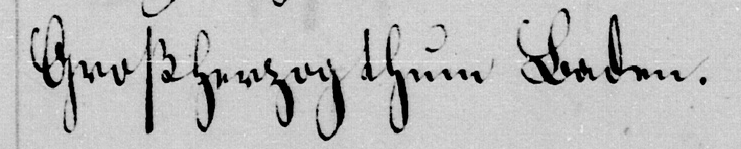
Großherzogthum Baden.
